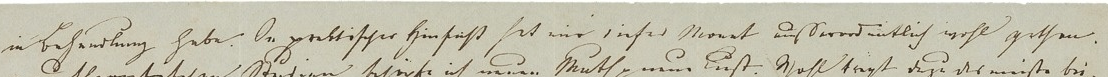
Hinsicht hat mir dieser Monat ausserordentlich wohl gethan
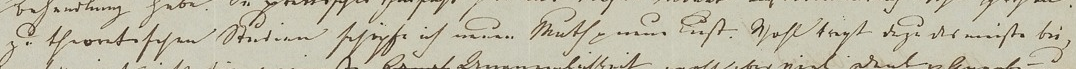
zu theoretischen Studien schöpfe ich neuen Muth & neue Lust. Wohl trägt dazu das meiste bei,
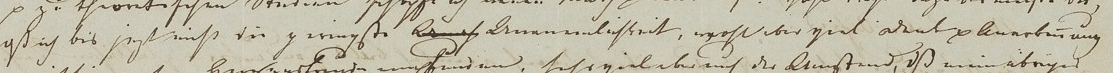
dß ich bis jezt nicht die geringste U... Unanemlichkeit, wohl aber viel Dank & Anerkennung
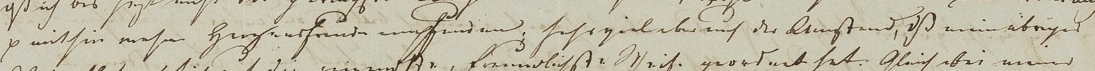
& mithin wahre Herzensfreude empfunden; sehr viel aber auch der Umstand, dß mein übriges
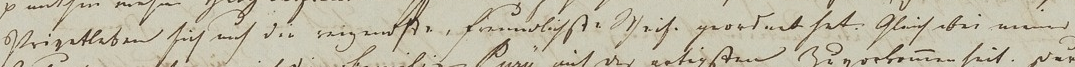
Privatleben sich auf die reizendste, freundlichste Weise geordnet hat. Gleich bei meiner
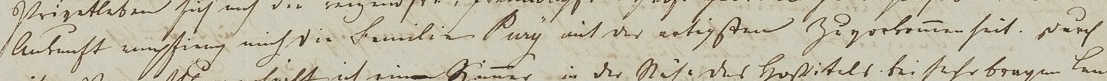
Ankunft empfieng mich die Familie Pury mit der artigsten Zuvorkommenheit. Durch
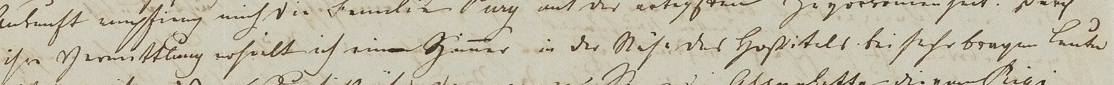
ihre Vermittlung erhielt ich ein Zimmer in der Nähe des Hospitals bei sehr braven Leuten
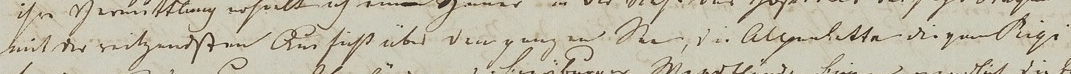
mit der reitzendsten Aussicht über den ganzen See, die Alpenkette die vom Rigi
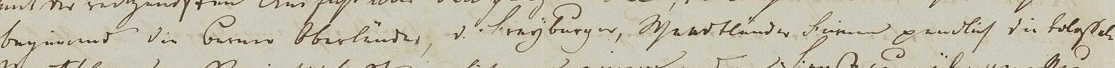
beginnend die Berner Oberländer, d.Freyburger, Waadtländer Firnen & endlich die kolossale
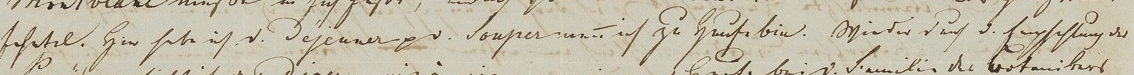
schatel. Hier habe ich d.Déjeuner &d.Souper wenn ich zu Hause bin. Wieder durch d. Empfehlung der
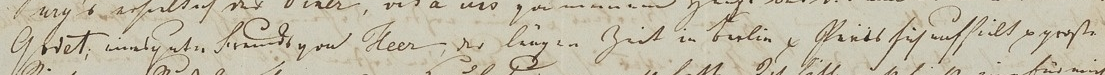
Godet, eines guten Freunds von Heer, der längere Zeit in Berlin & Paris sich aufhielt & große
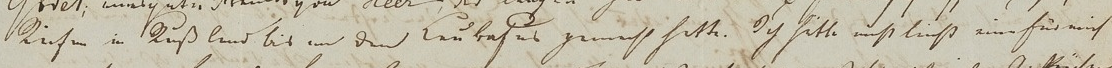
Reisen in Rußland bis an den Caukasus gemacht hatte. Ich hätte nicht leicht eine für mich
